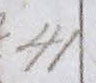41
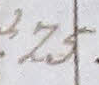25
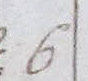6
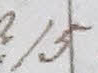15
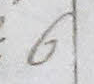6
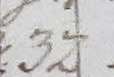32
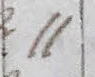11
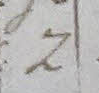2
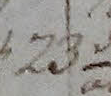23
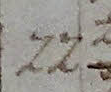22
